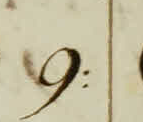9:
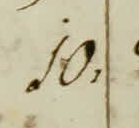10:
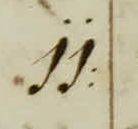11:
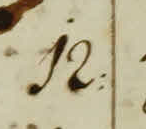12:
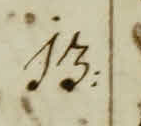13:
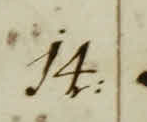14:
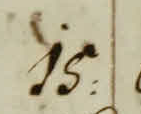15:
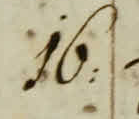16:
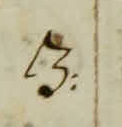3:
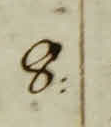8:
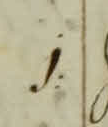1:
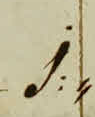1:
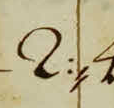2:
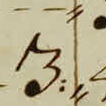3:
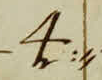4:
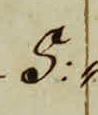5:
